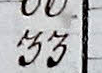33
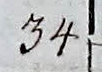34
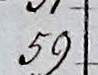59
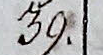39.
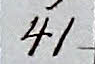41
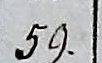59.
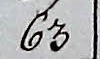63
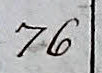76
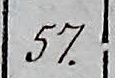57.
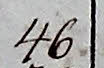46
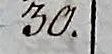30.
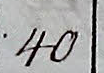40
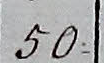50
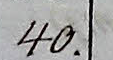40.
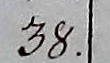38.
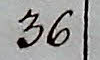36
